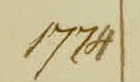1774
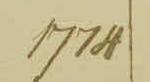1774
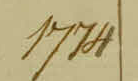1774
